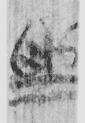爲
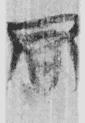君
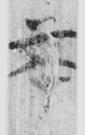不
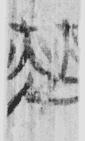勞
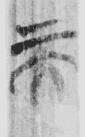而
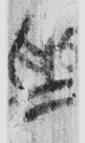爲
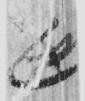臣
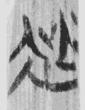勞
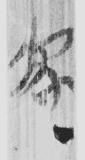虎
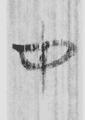中
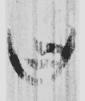曰
